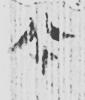{八十}
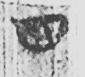四
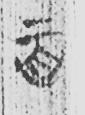百
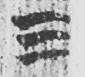三
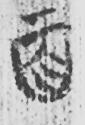百
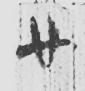廿
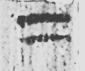二
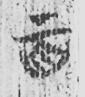百
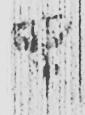{四十}
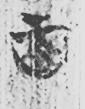百
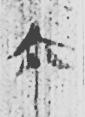六
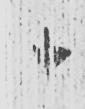十
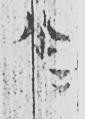八十=
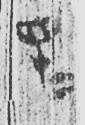四十=
